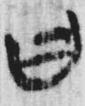曰
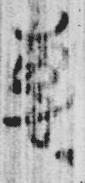惠
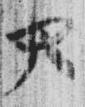四
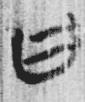曰
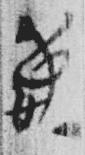○（仁）
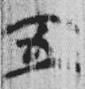五
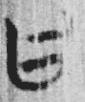曰
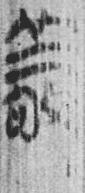敬
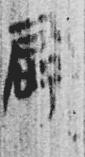君子
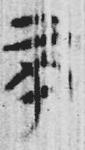不
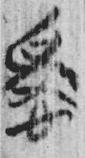○（緩）
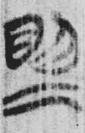則（則）
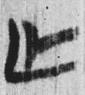亡（無）
